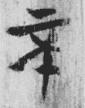不
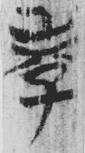孝
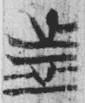者
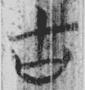古（故）
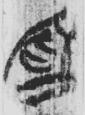爲
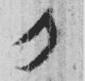人
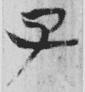子
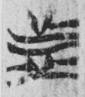者
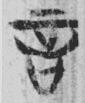言
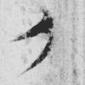人
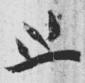之
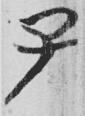子
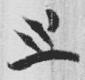之
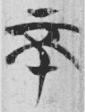不
